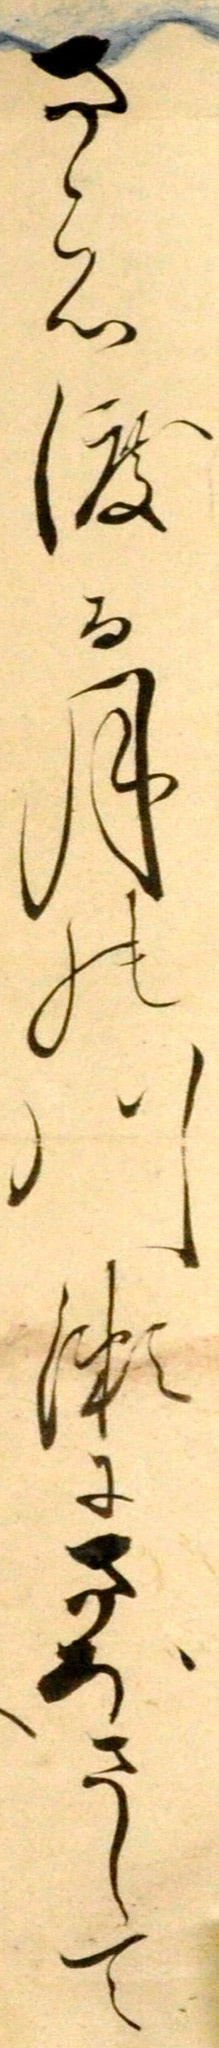さえ渡る月の川瀬にさほさして

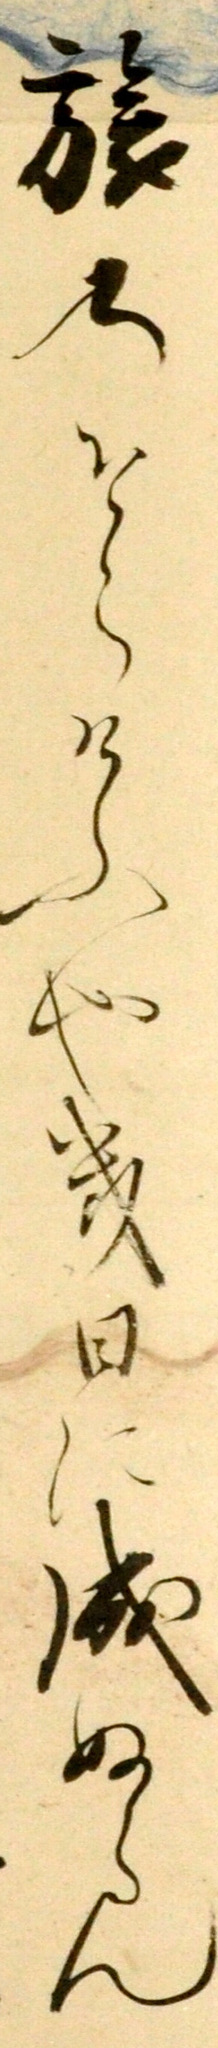旅のそらけふや幾日に成ぬらん
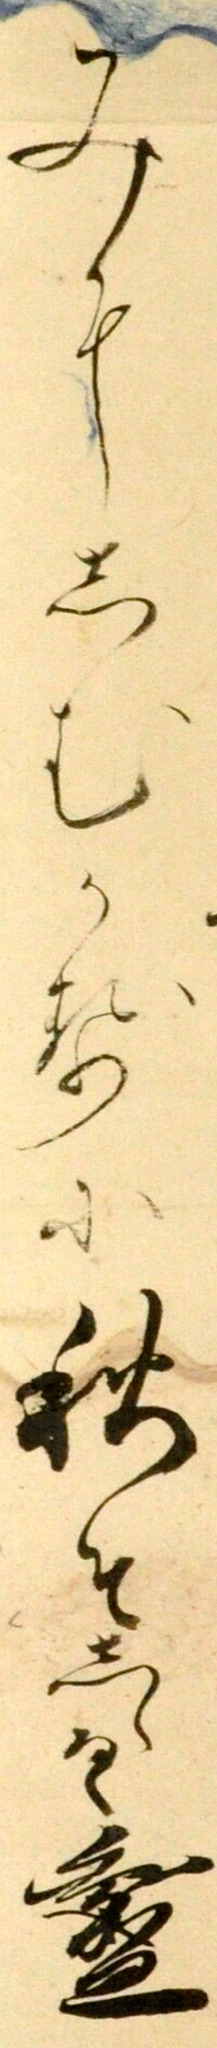みにしむかせに秋そしらるゝ円盛

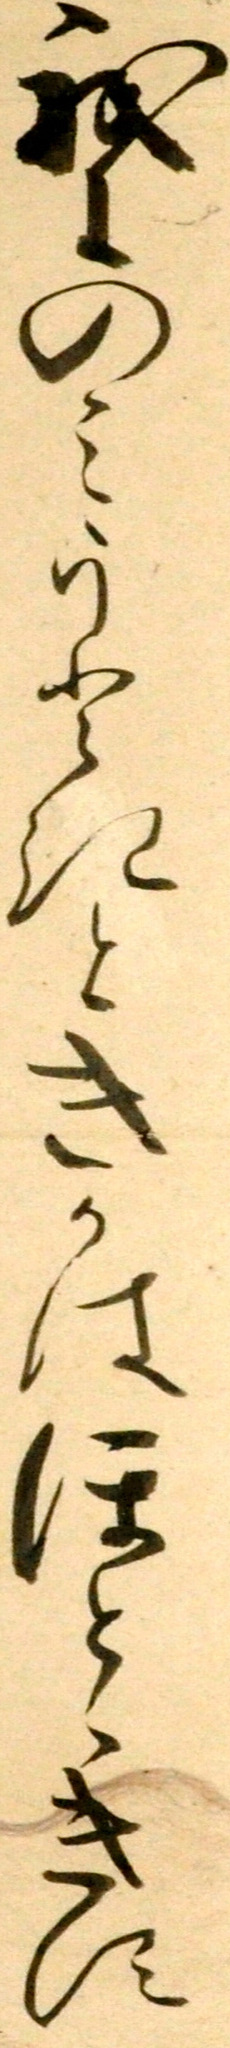我にのみうときときかはほとゝきす
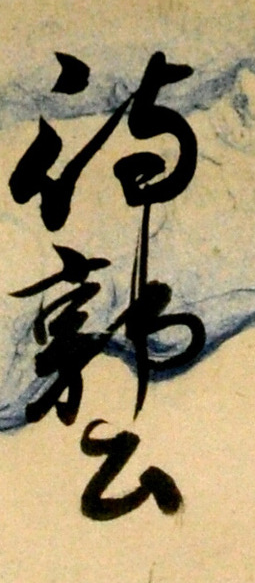待郭公
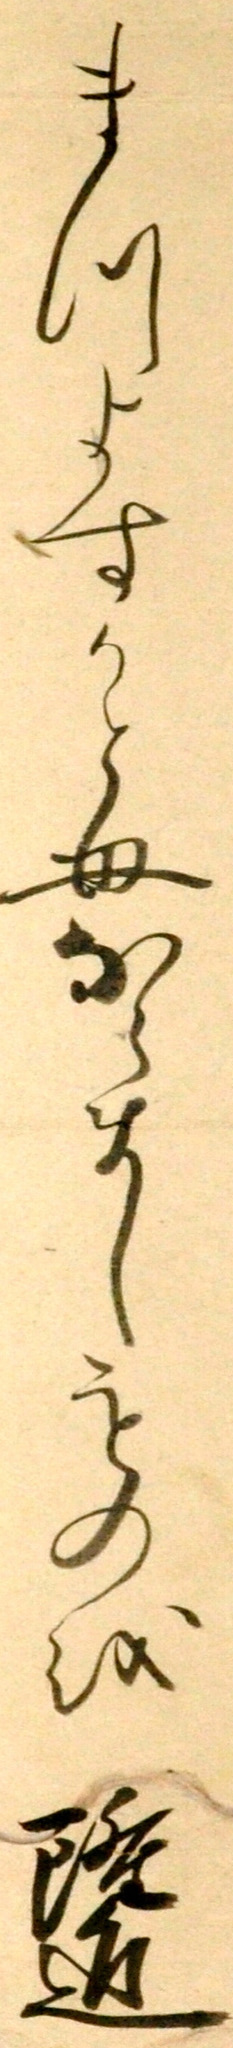まつよすかともならましものを隆近

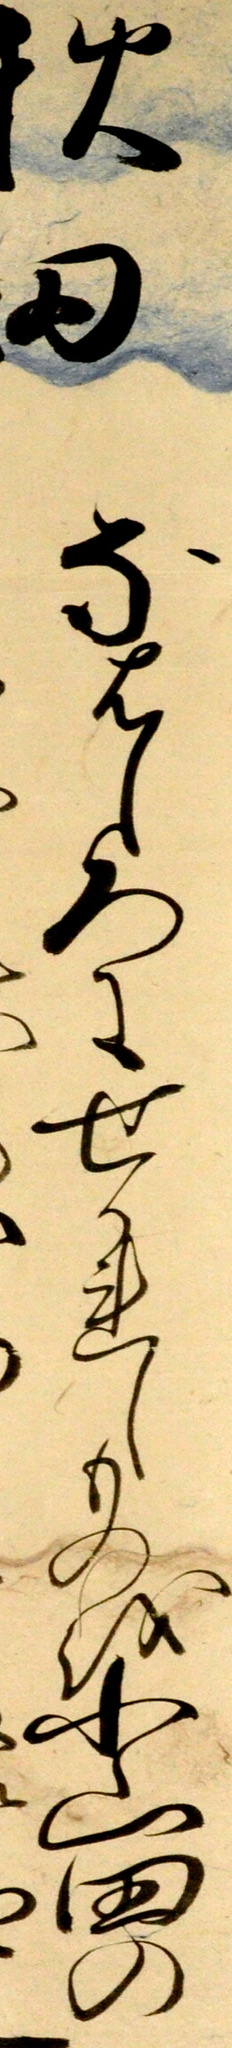なはしろにせかれしものを小山田の
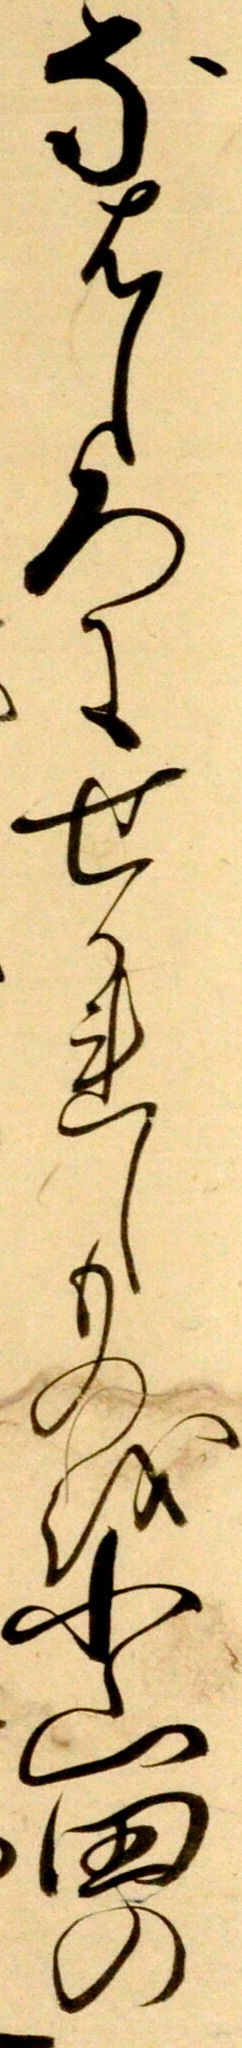なはしろにせかれしものを小山田の
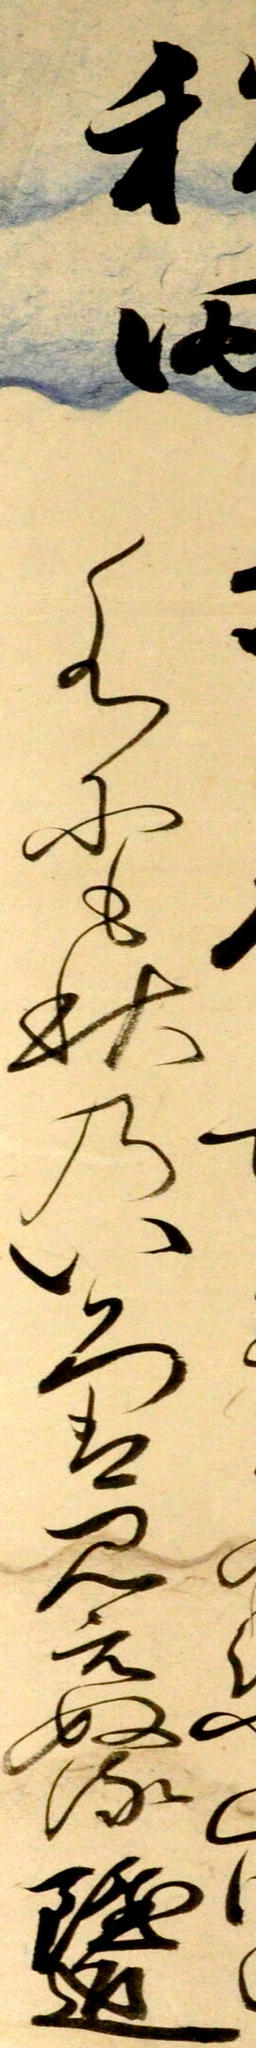水にも秋のいろは見えぬる隆近

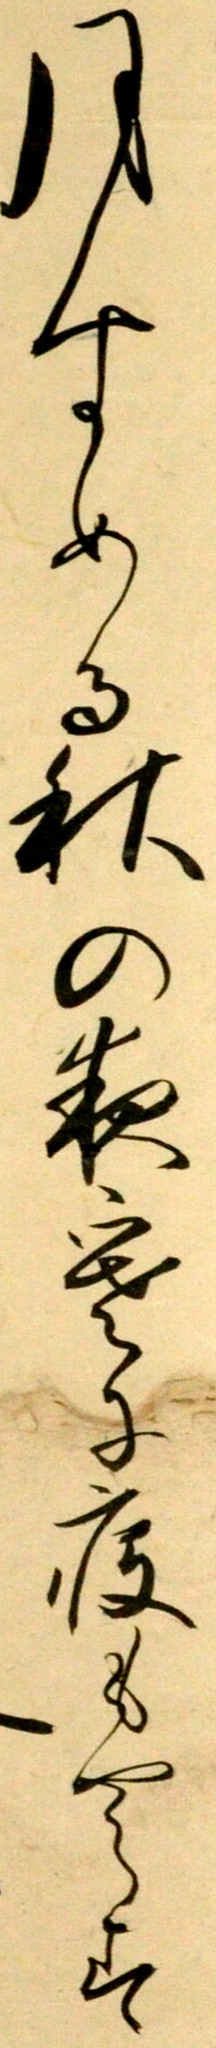月すめる秋の夜寒に寝もやらす
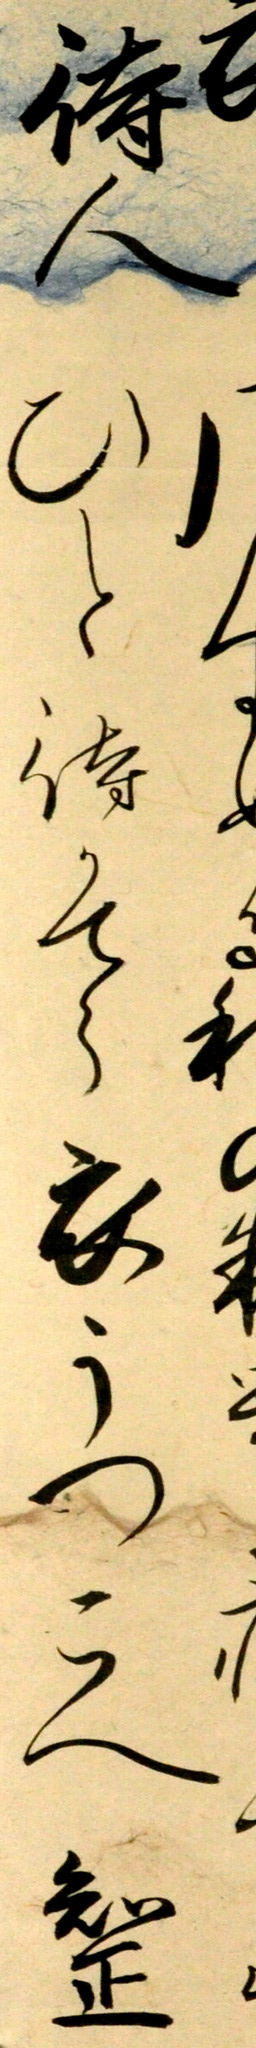ひと待かてら衣うつこへ知正

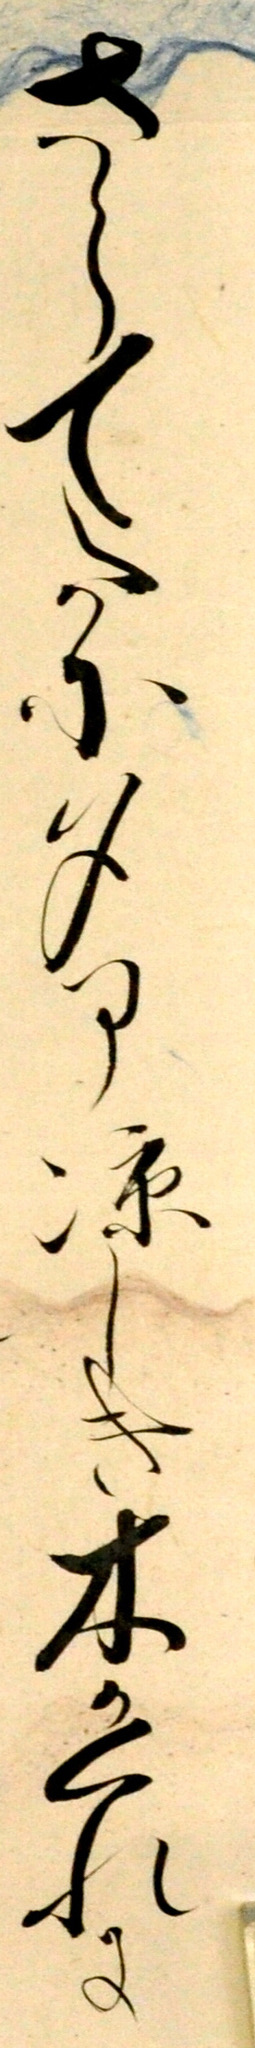さらてたに夕へ涼しき木かくれに
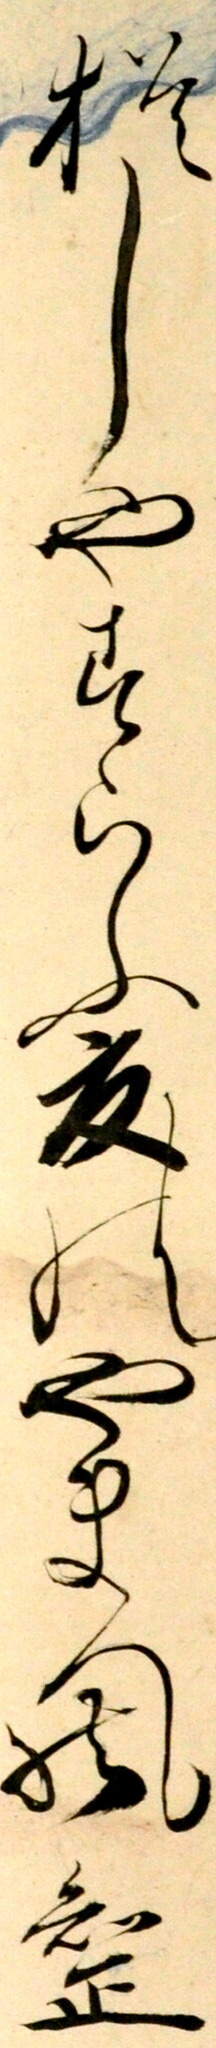猶しやすらふ夏のやま風知正

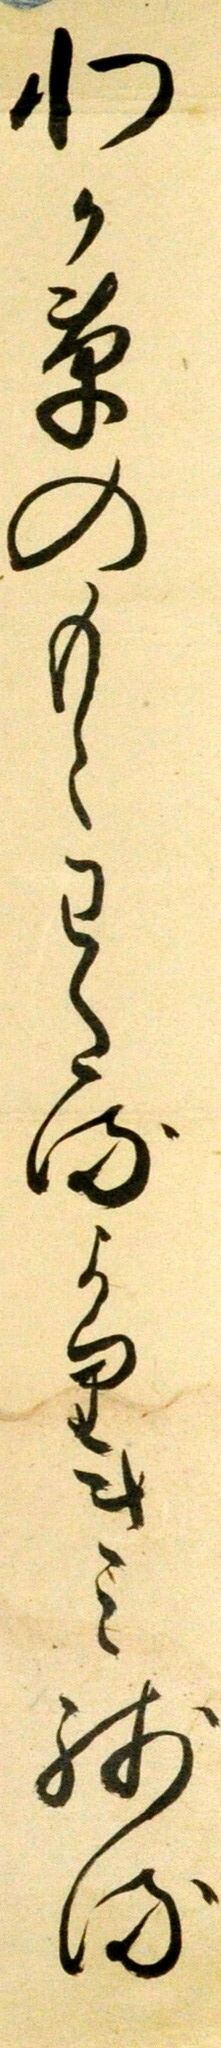わか草のもえわたるよりきこ残る
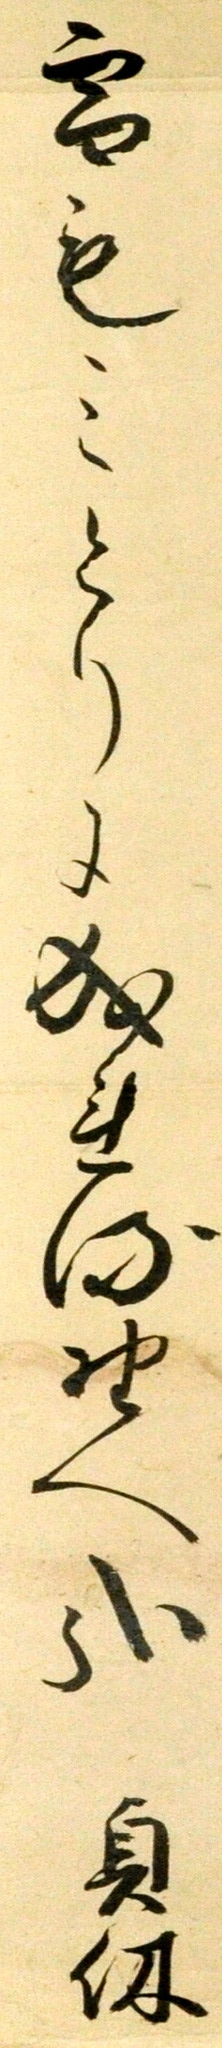雪もみとりに成れる野へ哉貞休
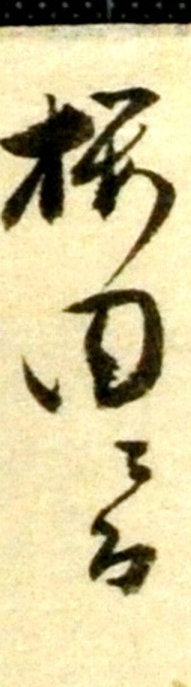桜田にて
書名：短冊
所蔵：伊那市立高遠町図書館・合同会社AMANE
